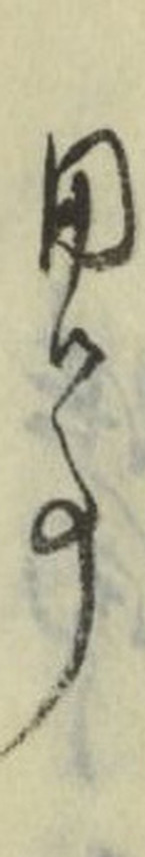用候事
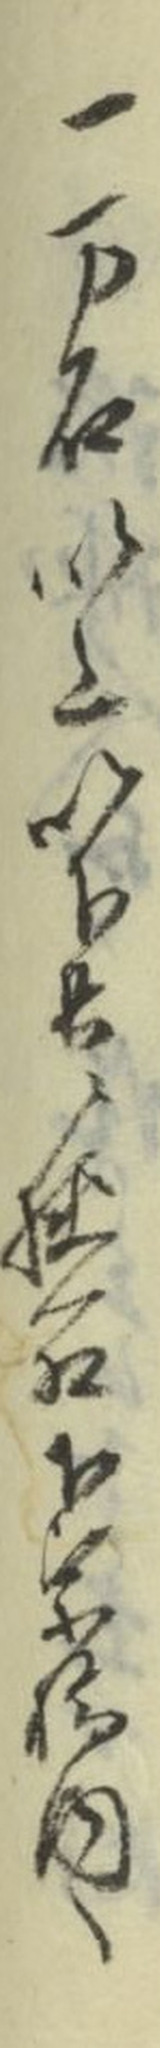一万石以上以下共に挟箱下乗橋内へ
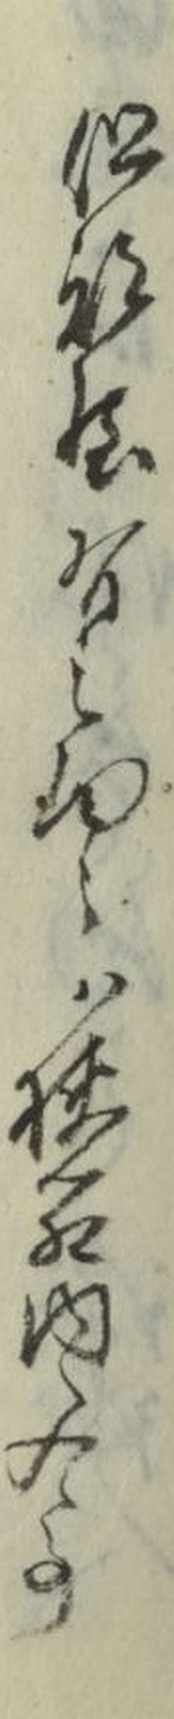但部屋有之面々は挟箱内へ入候事
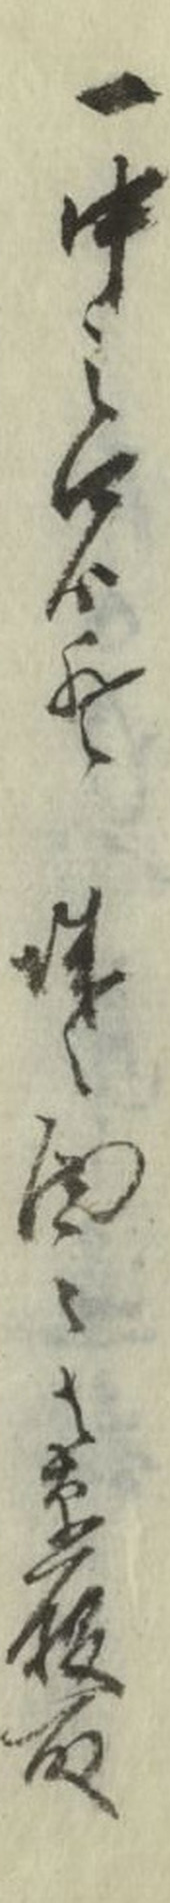一中之口ゟ登城之面々は草履取
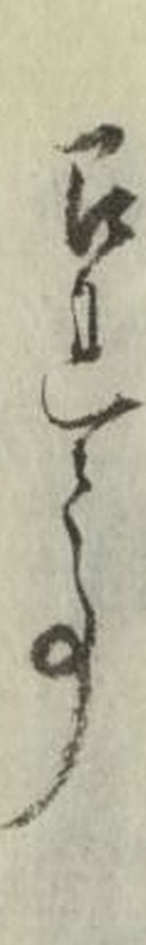召連候事
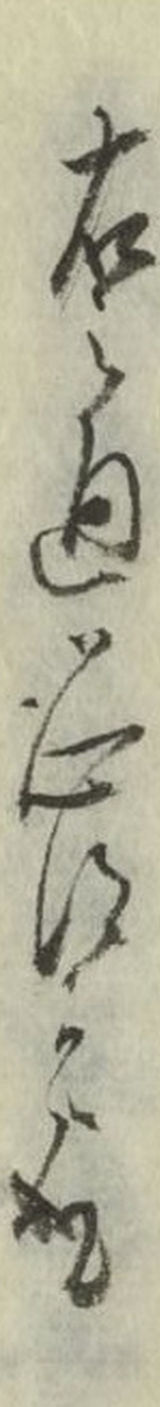右之通御心得可被成候

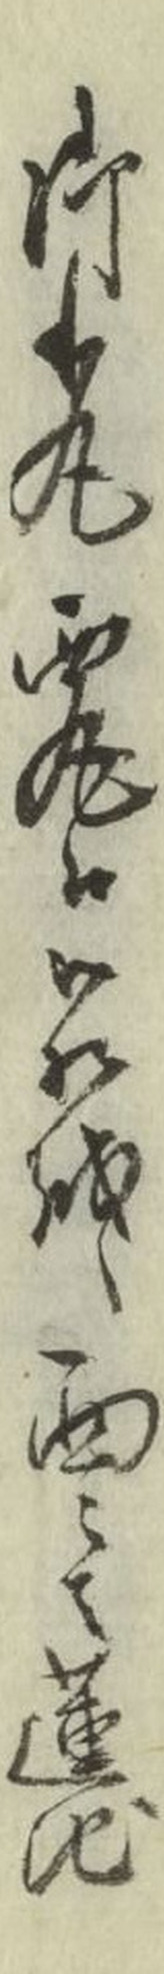御本丸西丸え罷越候面々は蓮池
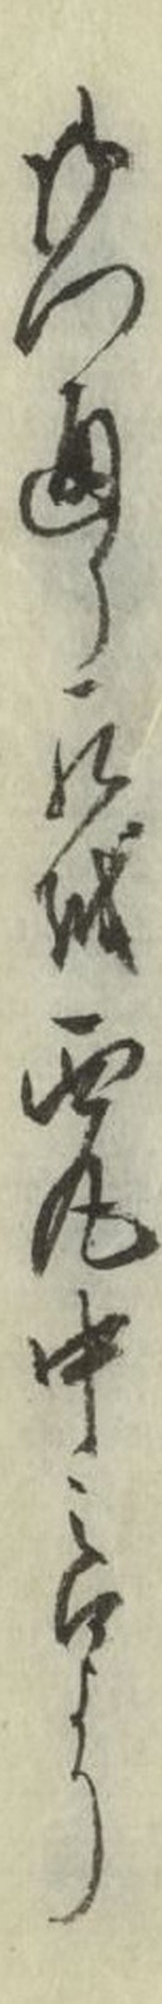御門通り罷越西丸中之口より
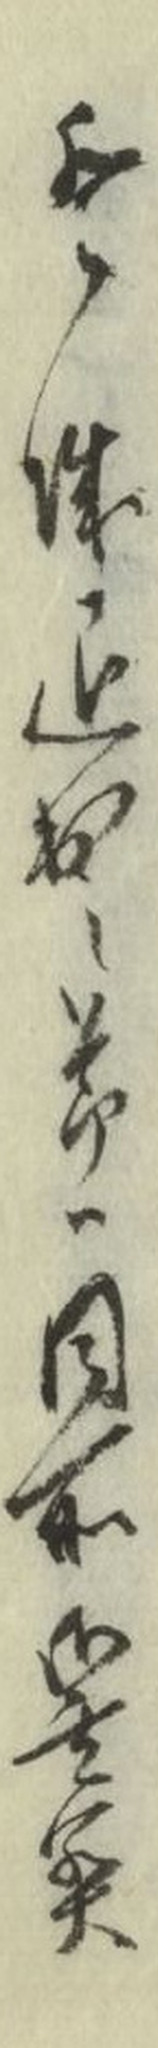登城退出之節は同所御玄関
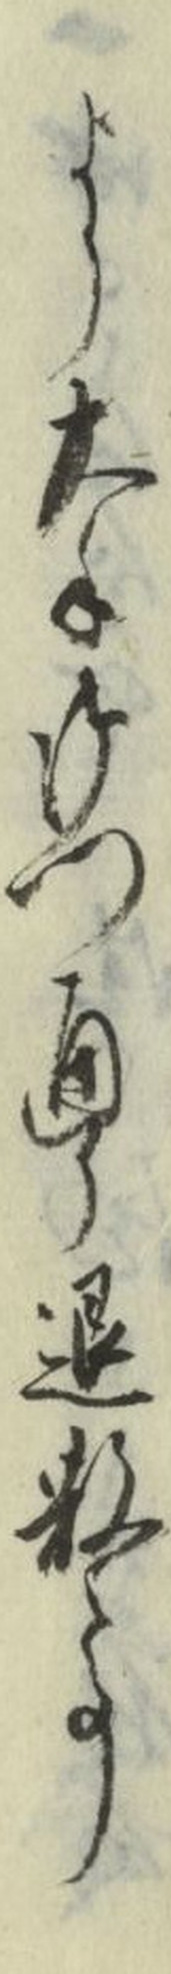より大手御門通り退散之事
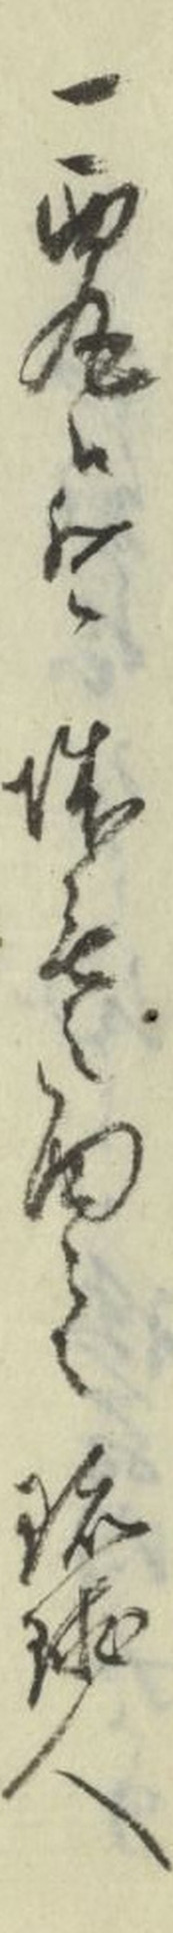一西丸え登城無之面々は琉球人
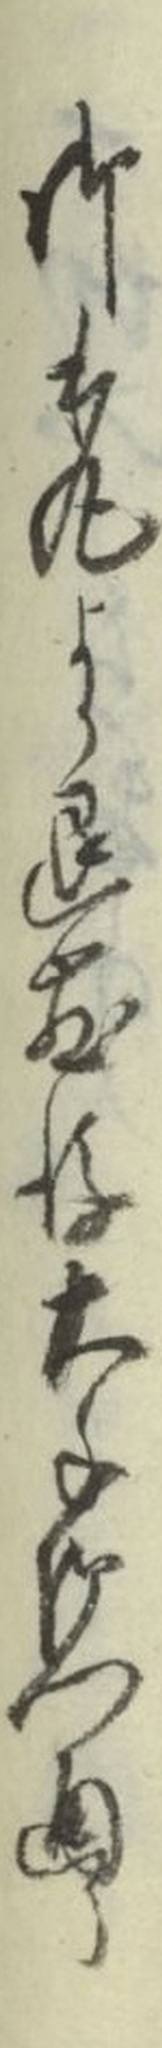御本丸より退散後大手御門通り
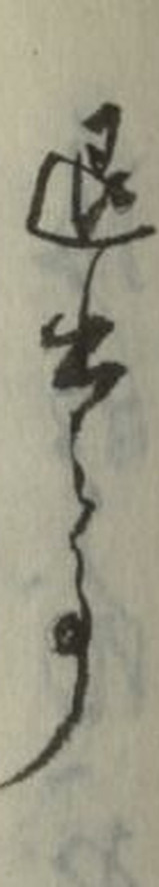退出之事
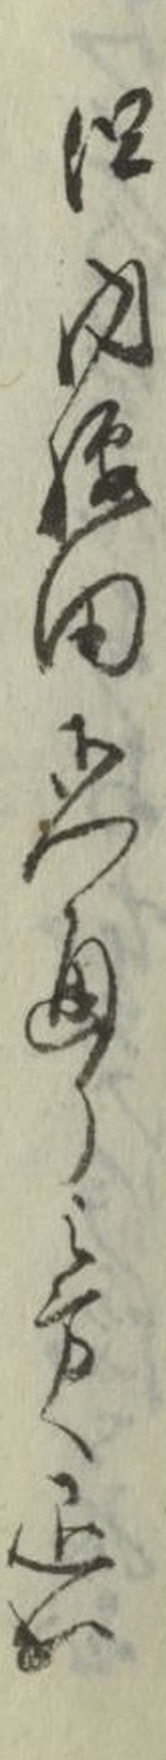但内桜田御門通り之方へ退出
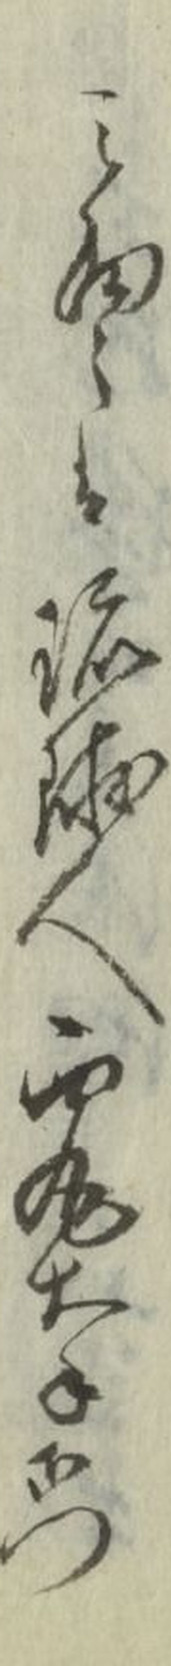之面々は琉球人西丸大手御門
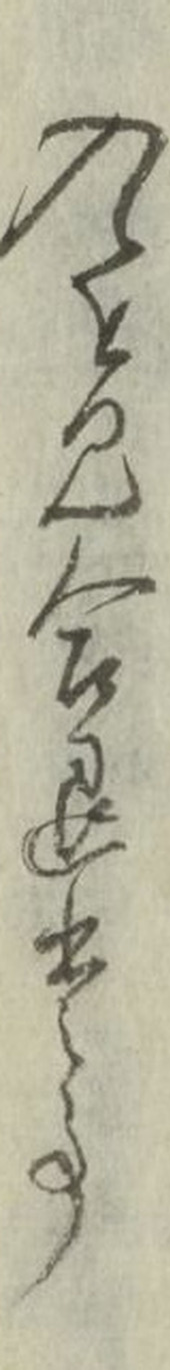入を見合退出之事
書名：琉球人来朝記 四之五
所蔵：University of the Ryukyus Library
